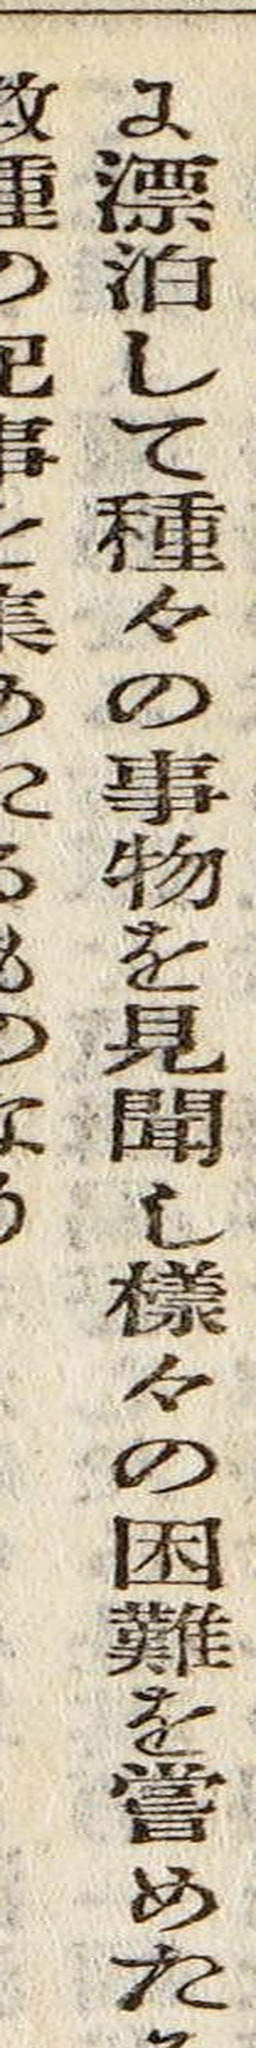数種の記事を集めたものなり
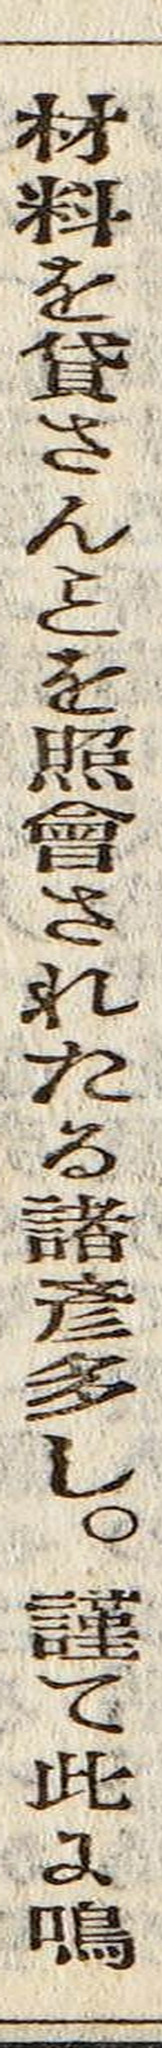材料を貸さんことを照会されたる諸彦多し。謹て此に鳴
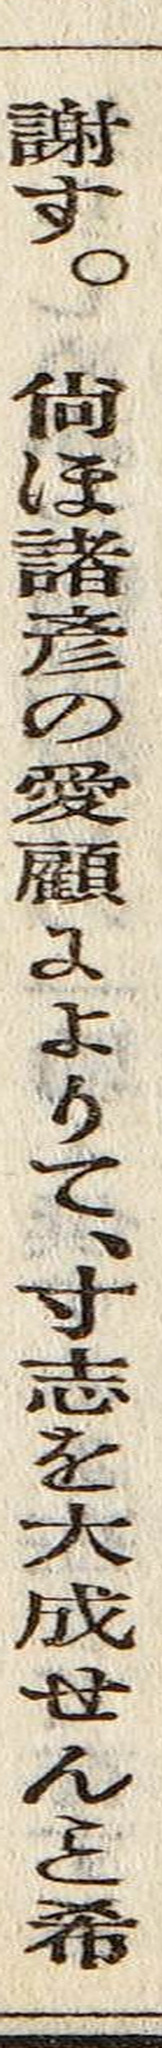謝す。尚ほ諸彦の愛顧によりて、寸志を大成せんこと希
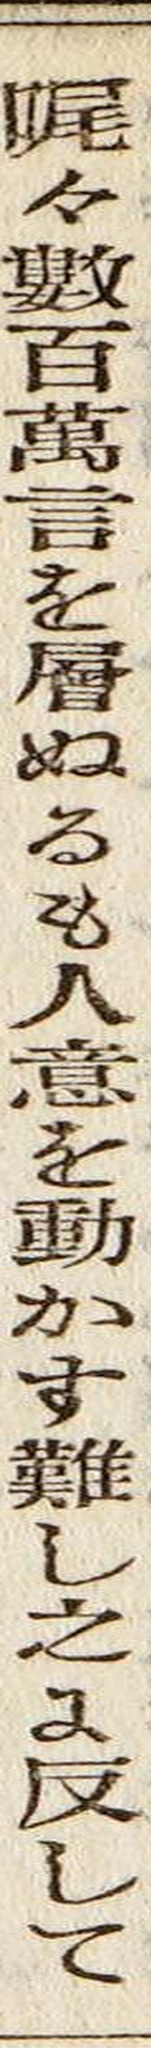⬜︎々数百萬言を層ぬるも人意を動かす難し之に反して
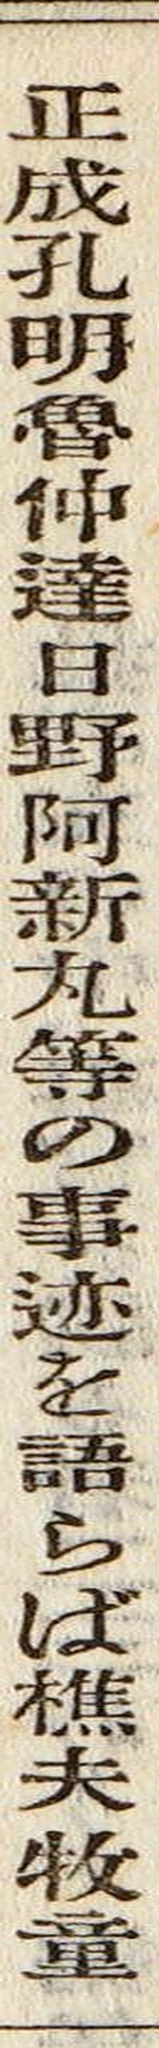正成孔明魯仲達日野阿新丸等の事迹を語らば樵夫牧童
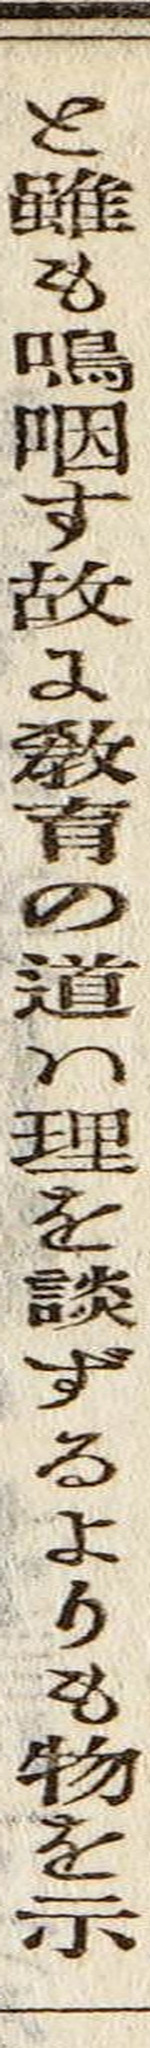と雖も鳴咽す故に教育の道は理を談ずるよりも物を示
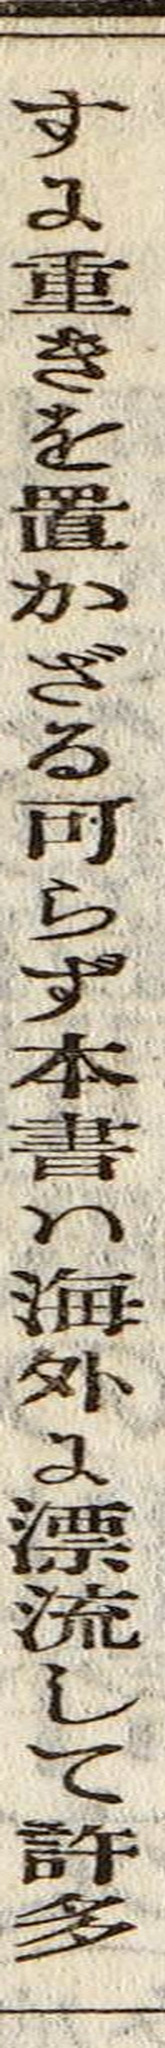すに重きを置かざる可らず本書は海外に漂流して許多
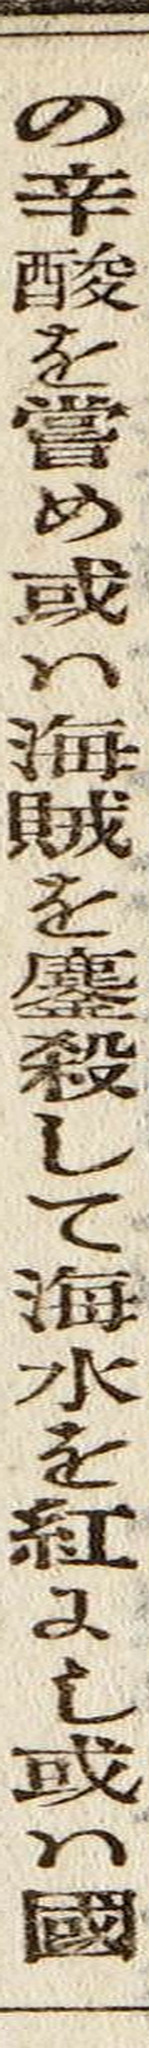の辛酸を嘗め或は海賊を鏖殺して海水を紅にし或は国
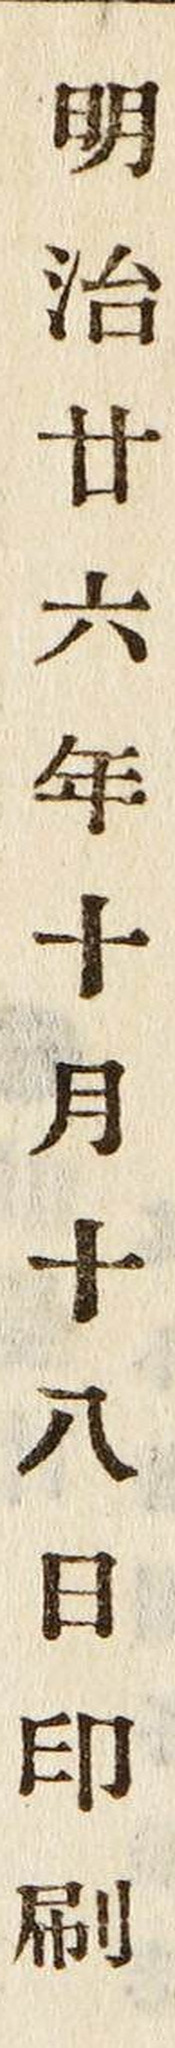明治廿六年十月十八日印刷
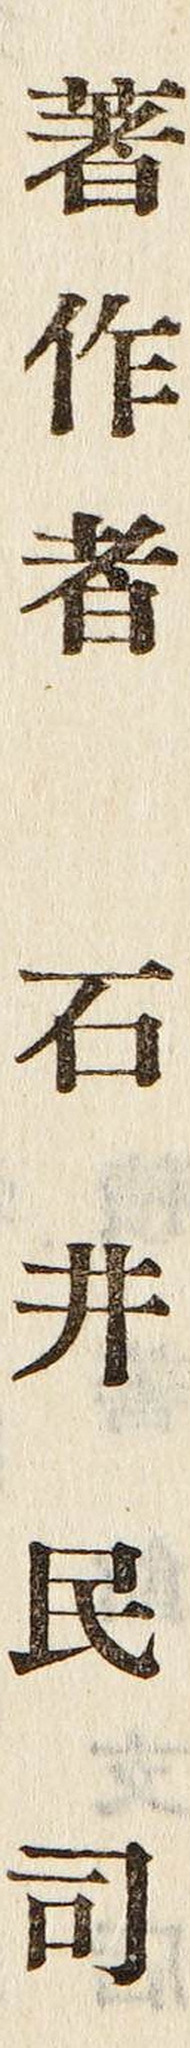著作者石井民司
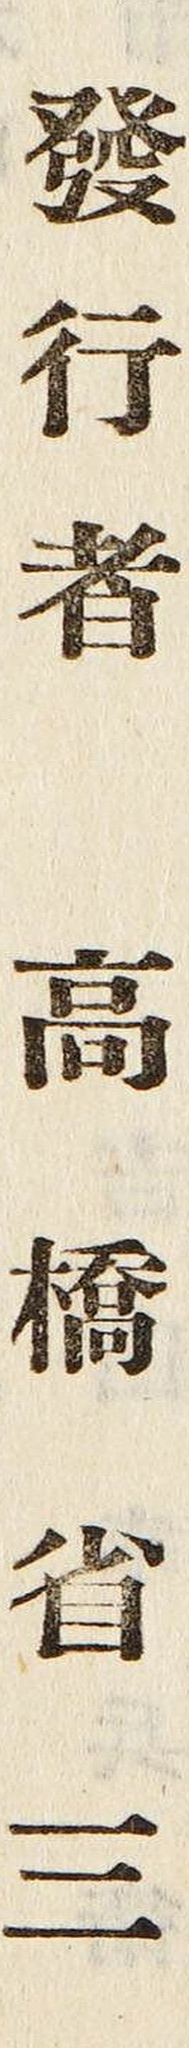発行者高橋省三
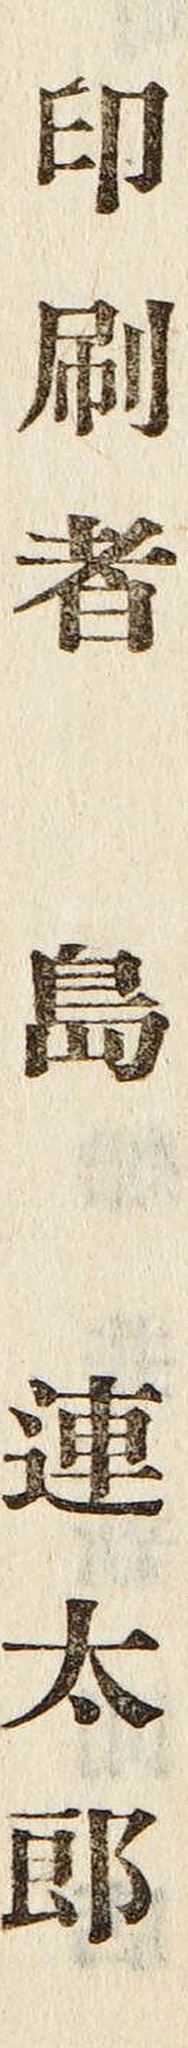印刷者島連太郎
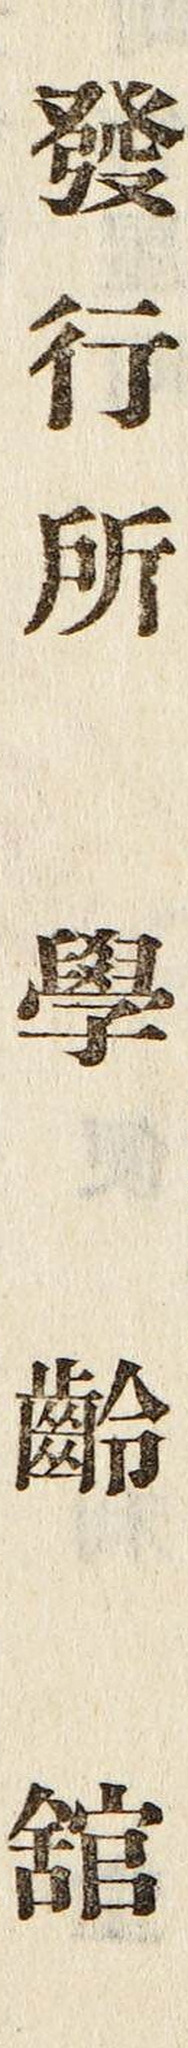発行所学齢館
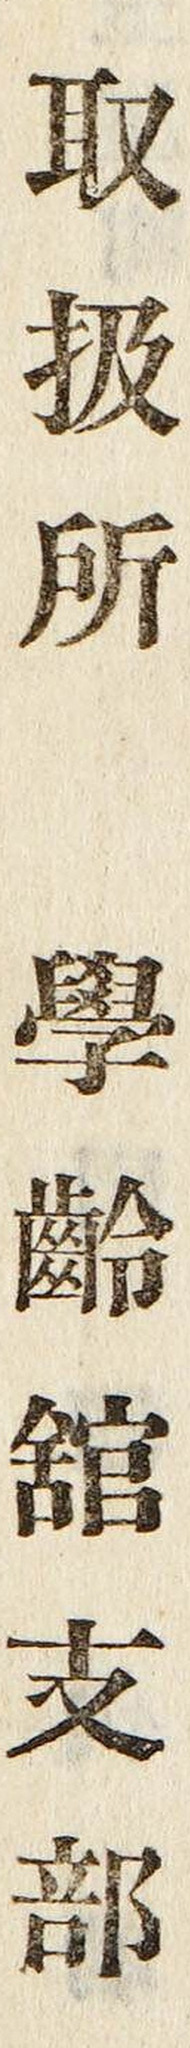取扱所学齢館支部
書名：日本漂流譚
